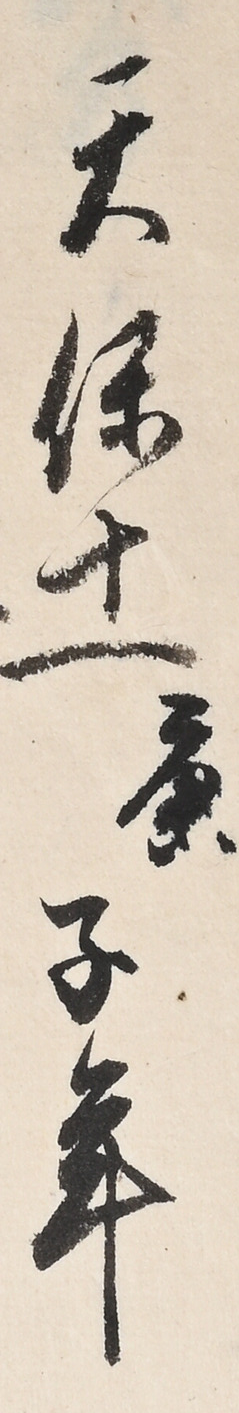天保十一庚子年
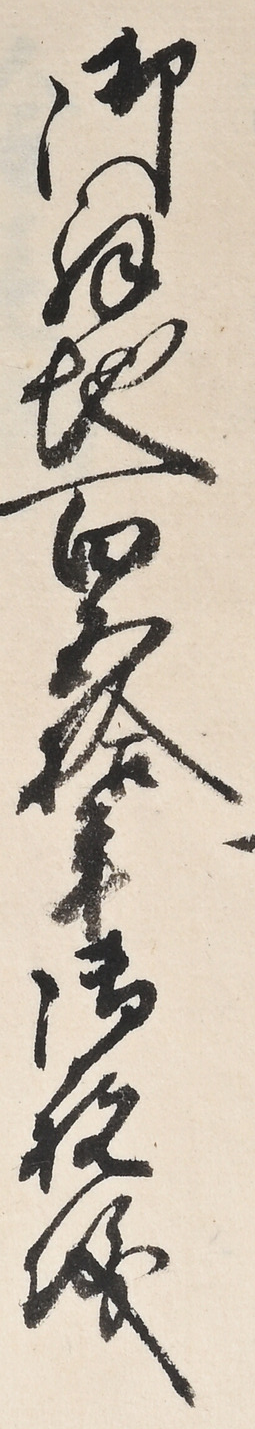御拝地百五拾年御祝儀
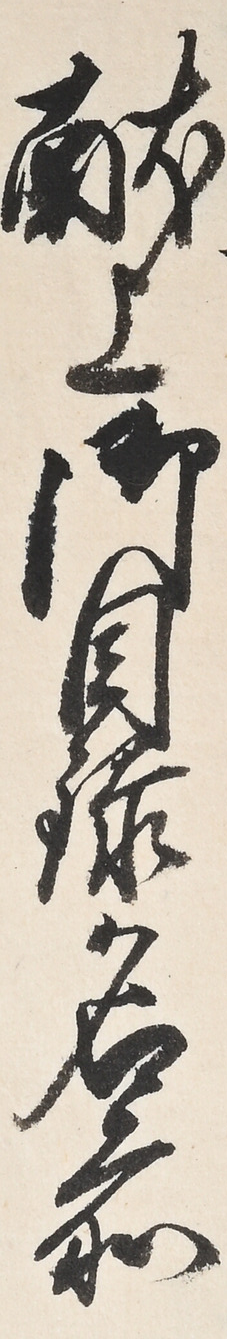献上御目録名前

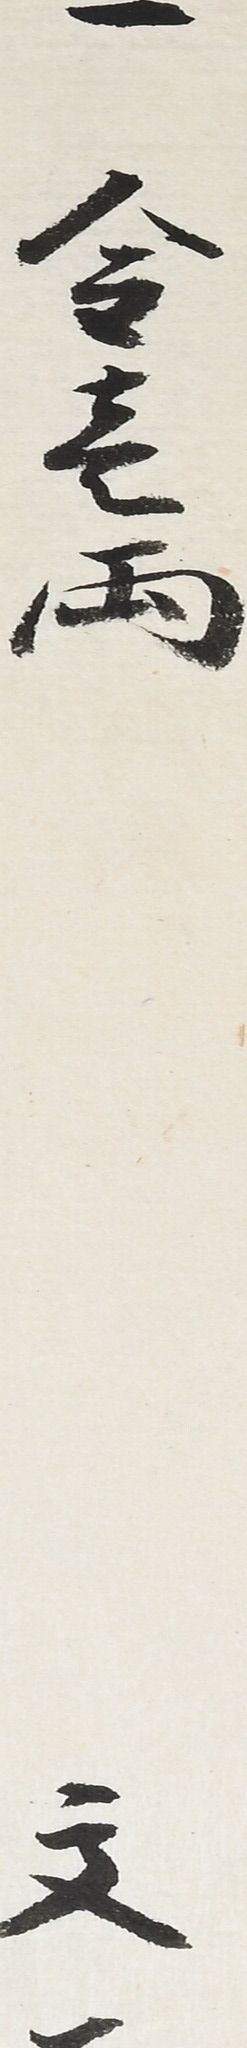一金壱両文蔵
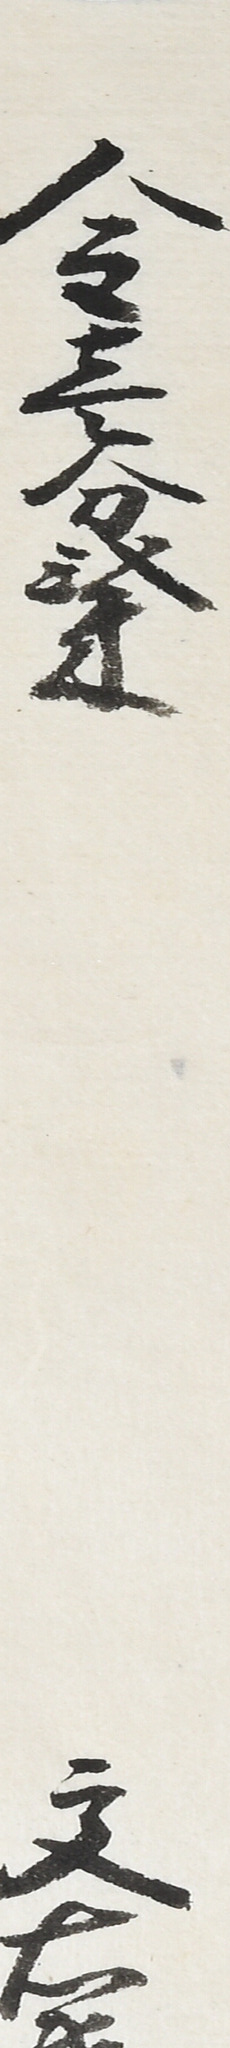一金壱分弐朱文右衛門

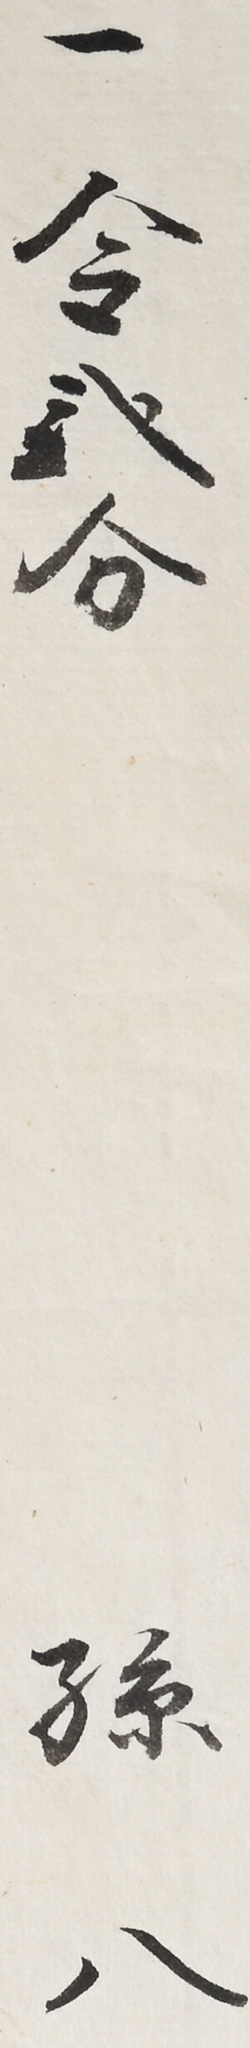一金弐分孫八
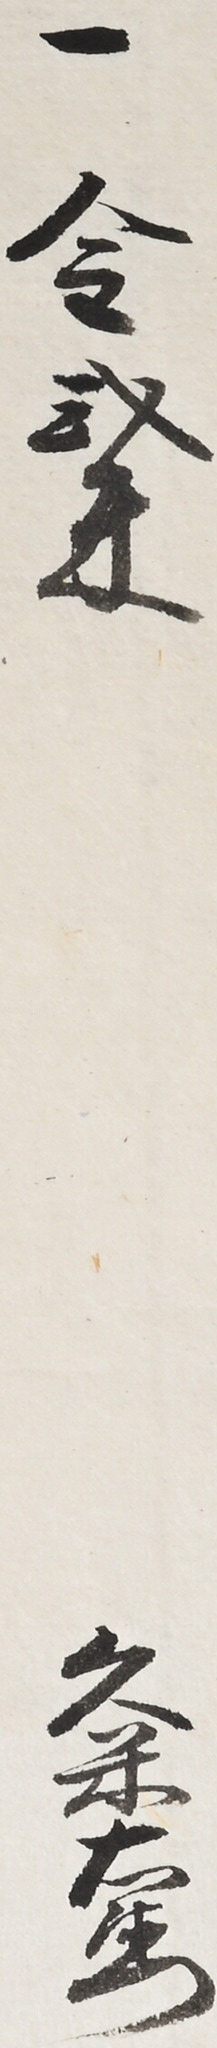一金弐朱久米右衛門
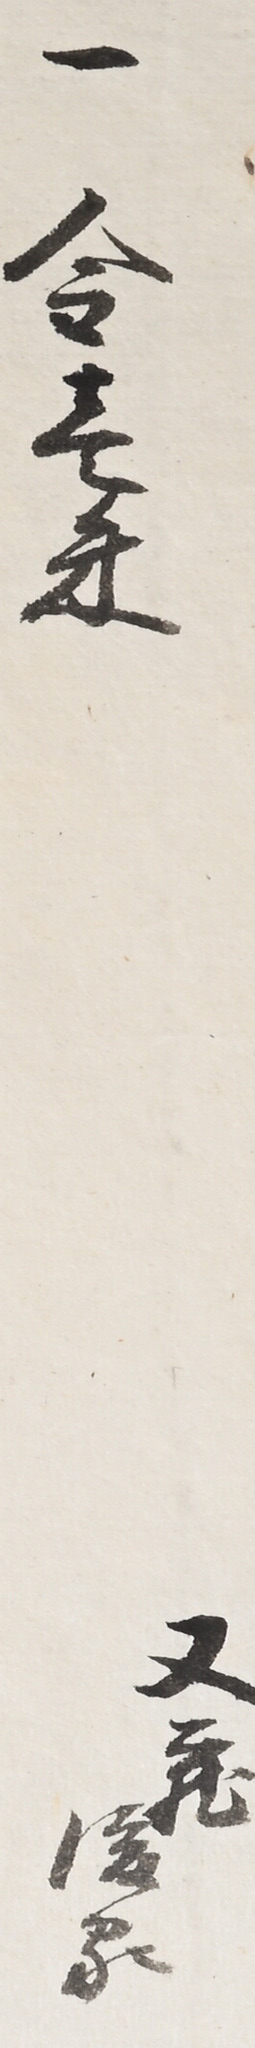一金壱朱又蔵後家
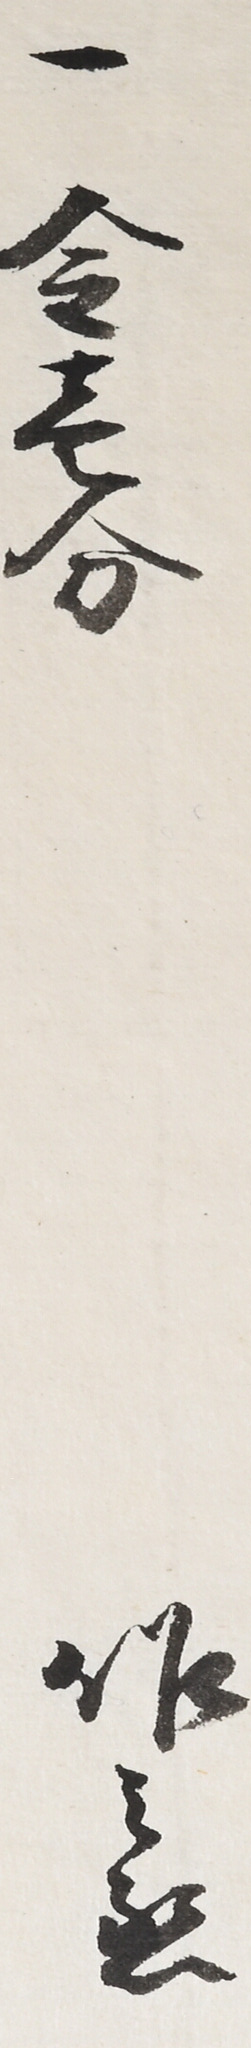一金壱分作之丞
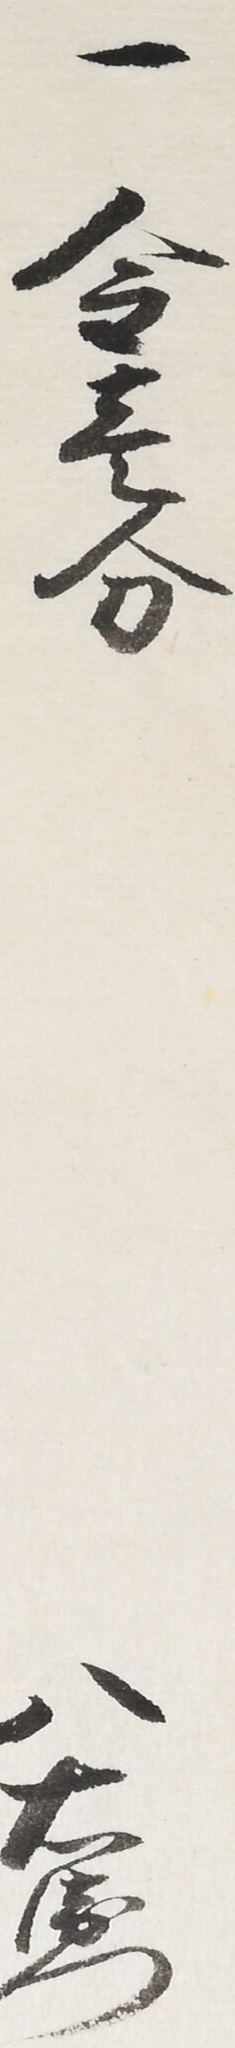一金壱分八右衛門
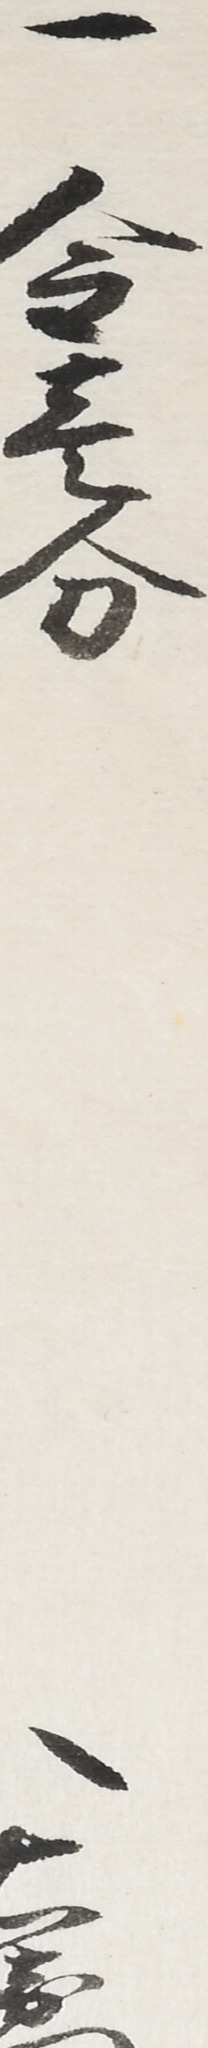一金壱分八右衛門
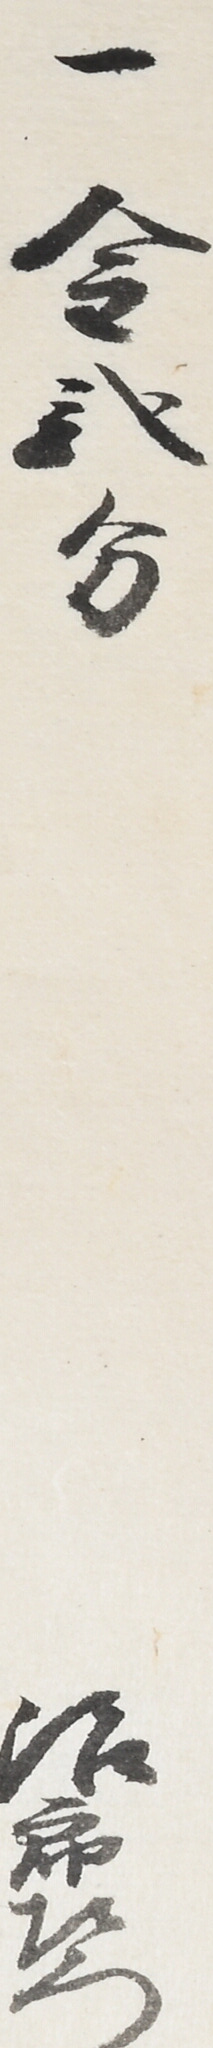一金弐分治郎左衛門
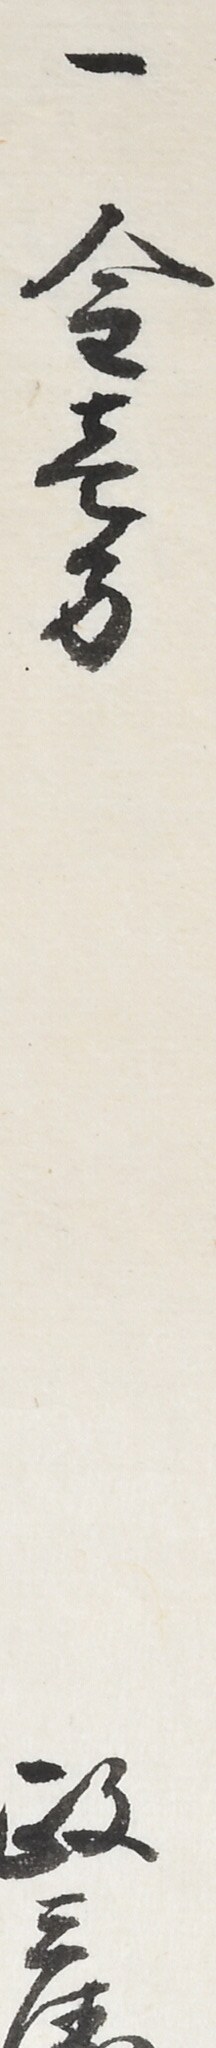一金壱分政兵衛
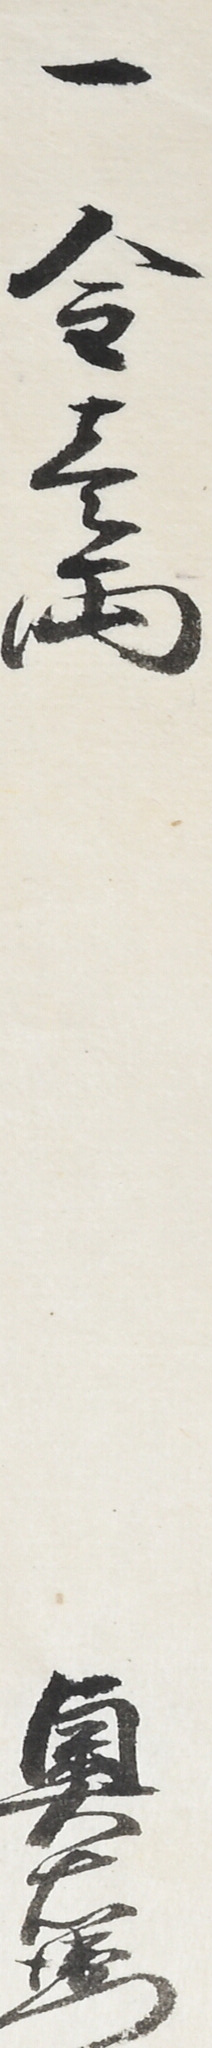一金壱両奥右衛門

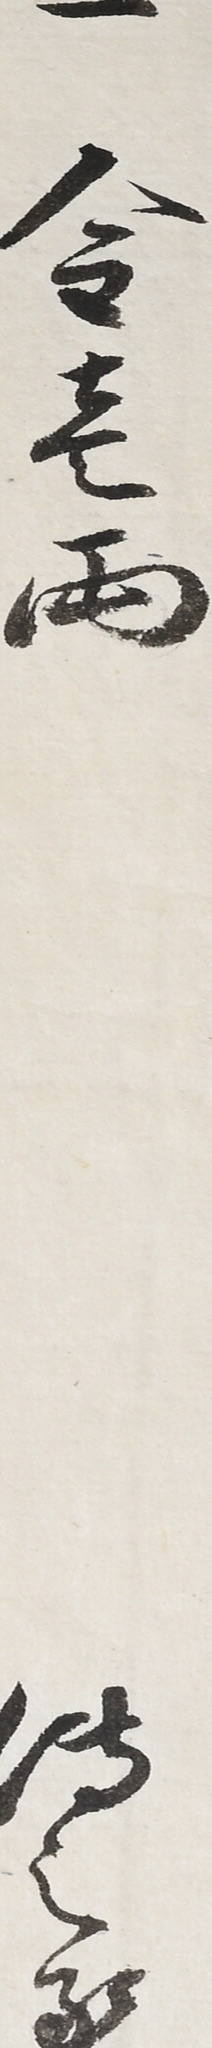一金壱両伝之丞
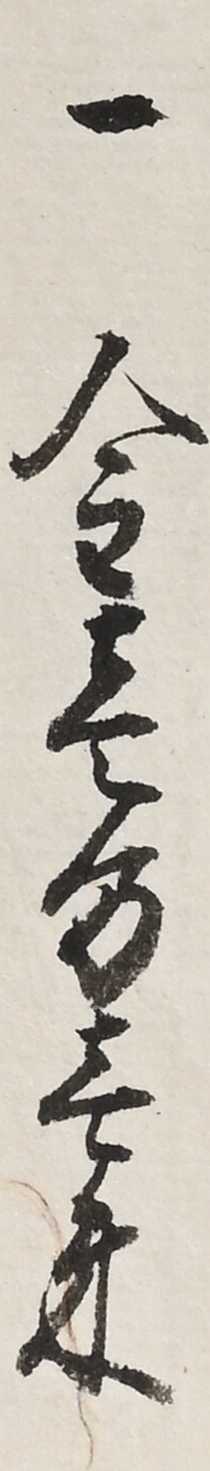一金壱分嘉蔵
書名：御拝地百五拾年御祝儀献上御目録名前
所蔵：伊那市立高遠町図書館・合同会社AMANE
